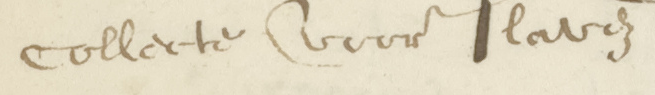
collecte voor slaven
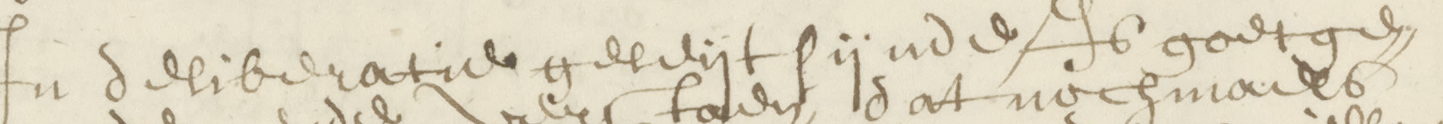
In deliberatie geleijt sijnde Is goetge,,
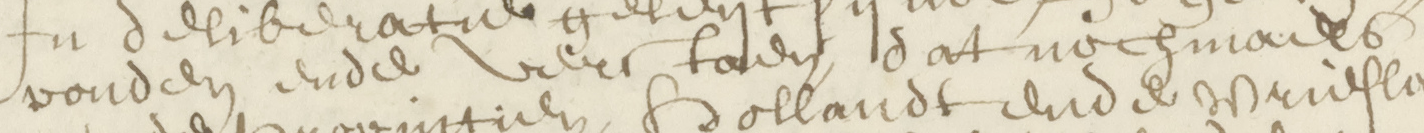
vonden ende verstaen, dat nochmaels
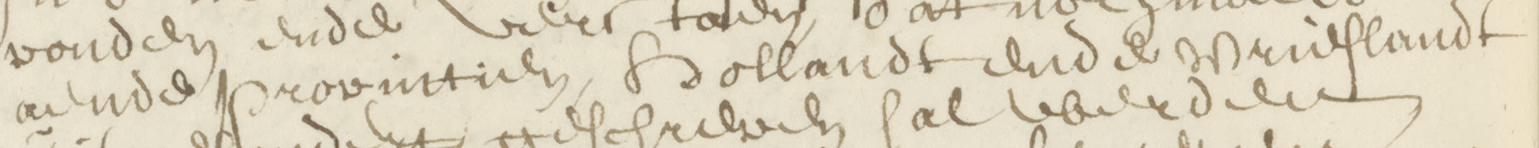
aende provintien, Hollandt ende Vrieslandt
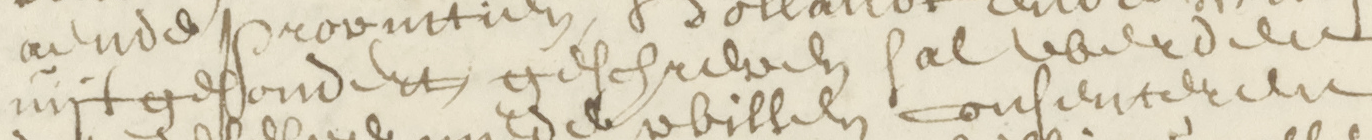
uijtgesondert, geschreven sal werden
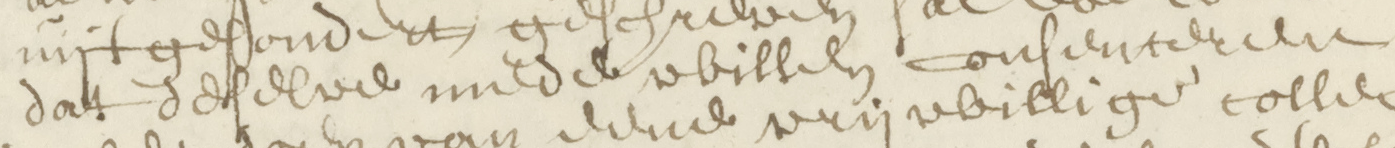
dat deselve mede willen consenteren
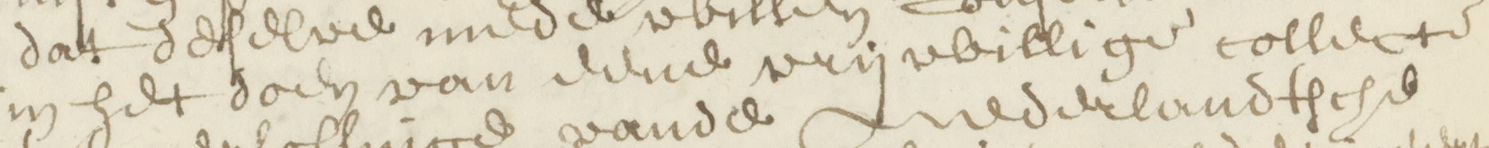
in het doen van eene vrijwillige collecte
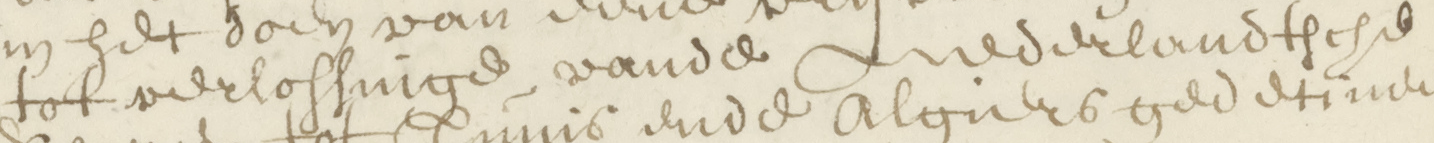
tot verlossinge vande Nederlandtsche
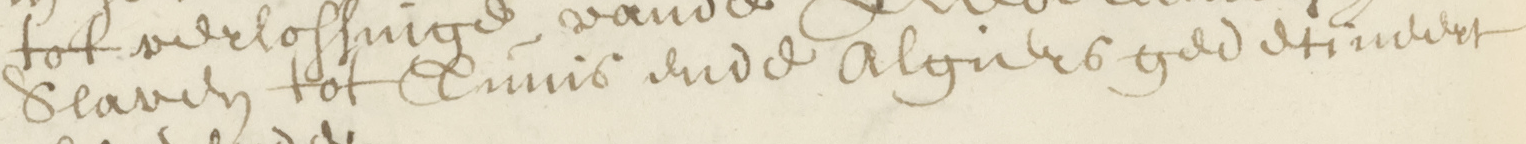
Slaven tot Tunis ende Algiers gedetineert
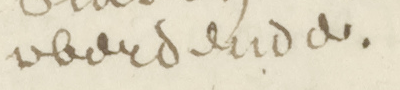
werdende.
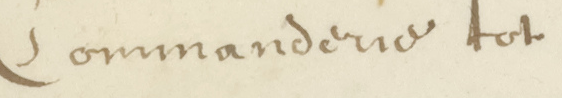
Commanderie tot
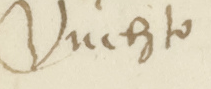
Vuchte
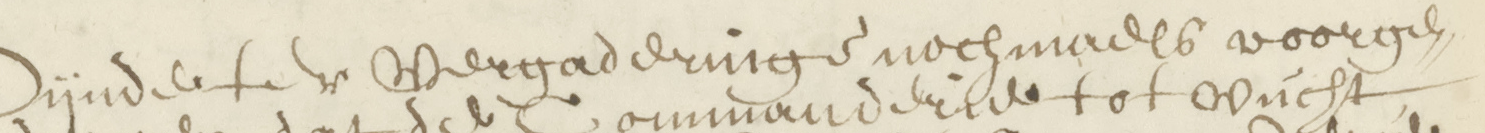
Sijnde ter Vergaderinge nochmaels voorge,,
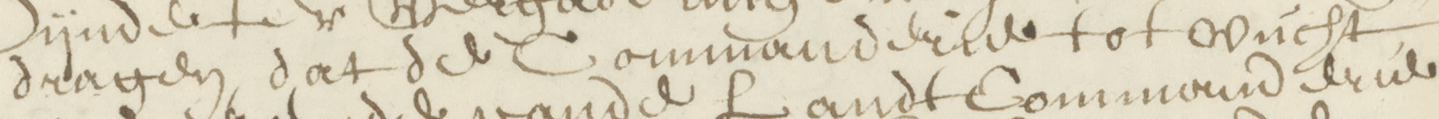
dragen, dat de Comanderie tot Vucht,
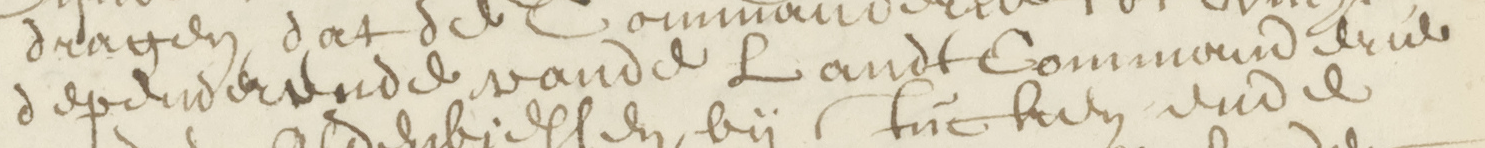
dependerende vande Landt Commanderie
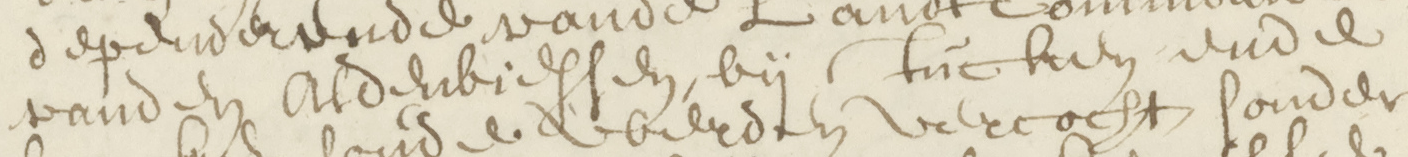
vanden Aldenbiessen, bij stucken ende
